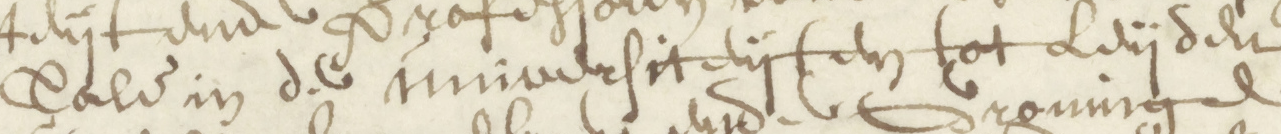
Tale in de Universiteijten tot Leijden,
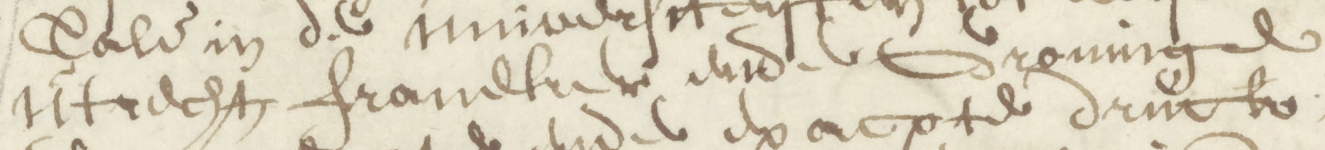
Utrecht, Franeker ende Groninge,
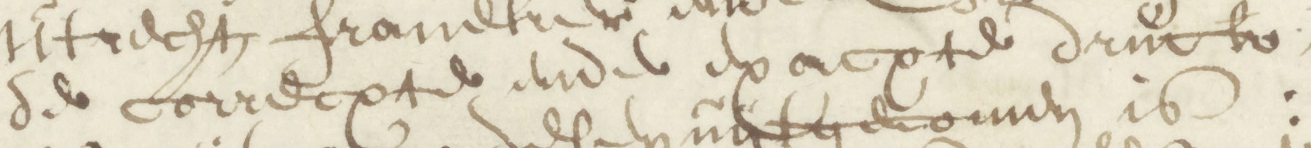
de correcxte ende exacxte druck,
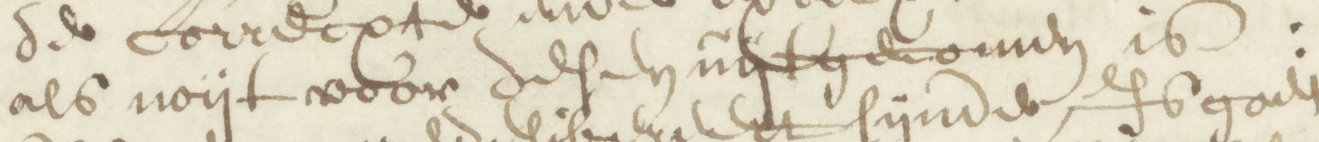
als noijt voor desen uijtgecomen is:
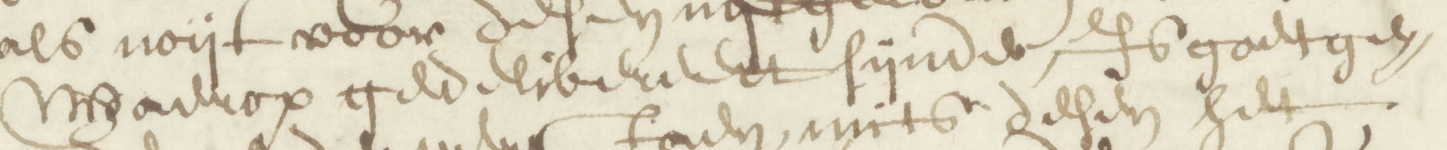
Waerop gedelibereert sijnde, Is goetge„
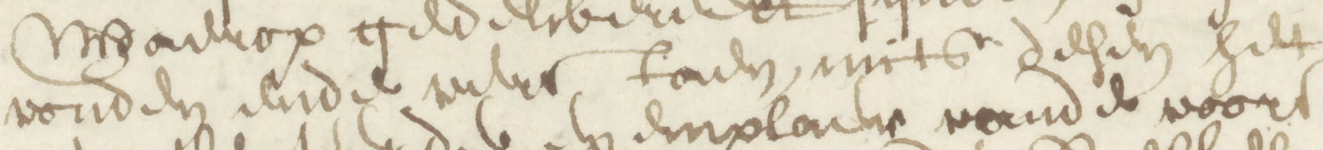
vonden ende verstaen, mits desen het
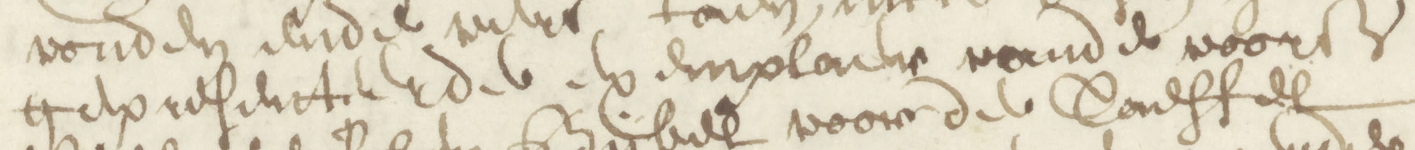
gepresenteerde exemplaer vande voors
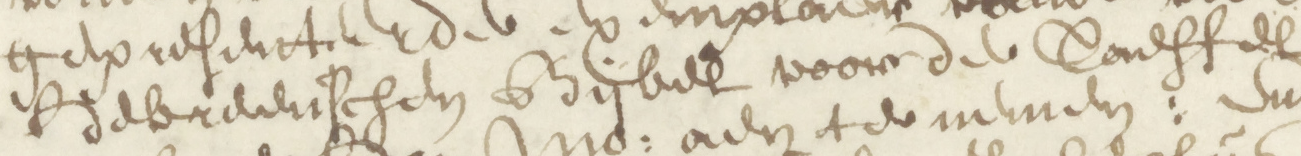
Hebreeuschen Bijbel voor de Taeffel
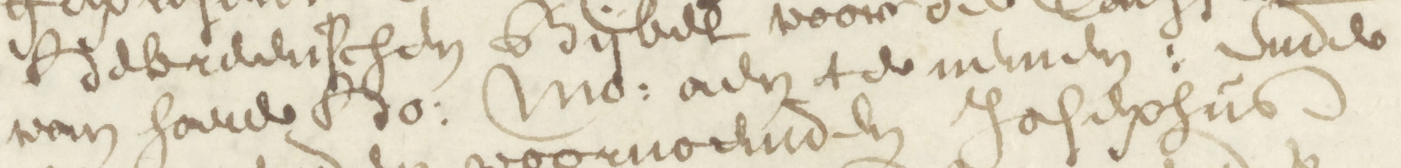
van hare Ho:Mo: aen te nemen: Ende
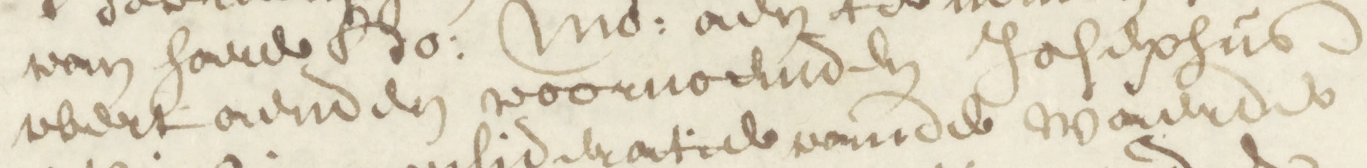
wert aenden voornoemden Joshephus
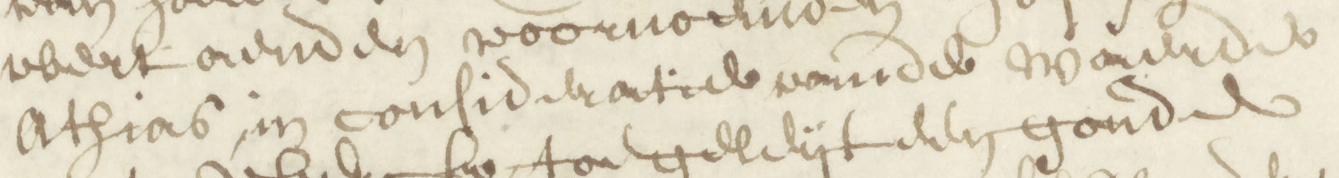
Athias, in consideratie vande Waerde
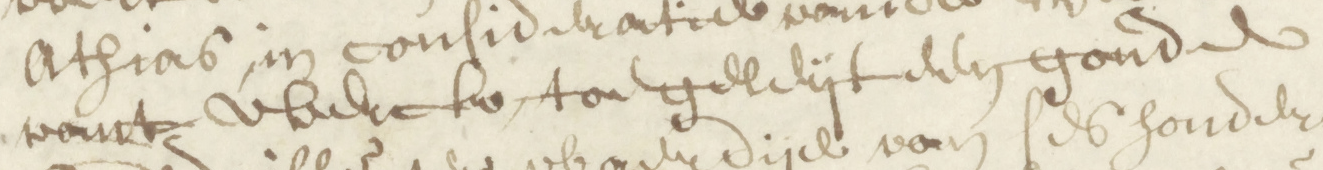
vant werck, toegeleijt een goude
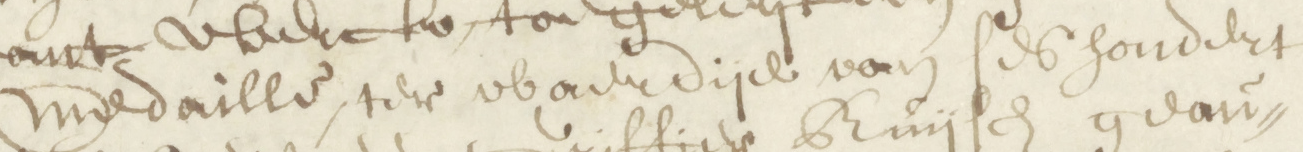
medaille, ter waerdije van ses hondert
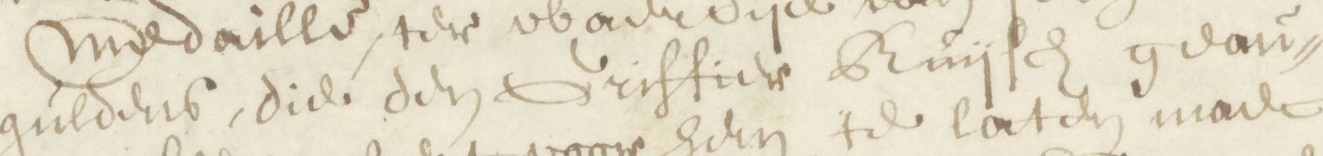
guldens, die den Griffier Ruijsch geau„
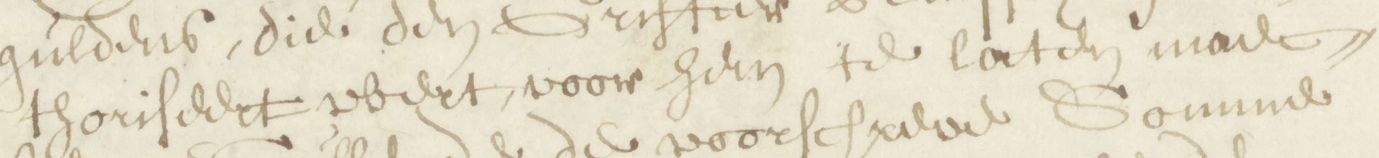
thoriseert wert, voor hem te laten maec„
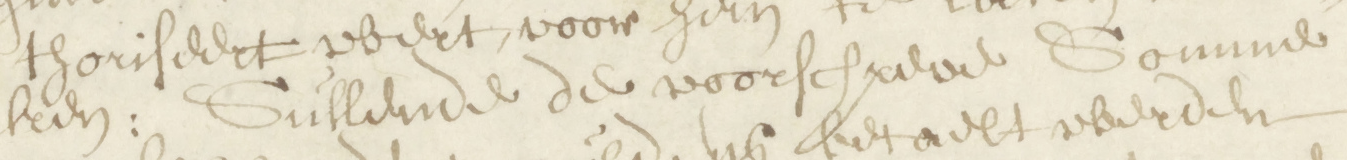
ken: Sullende de voorschreve Somme
